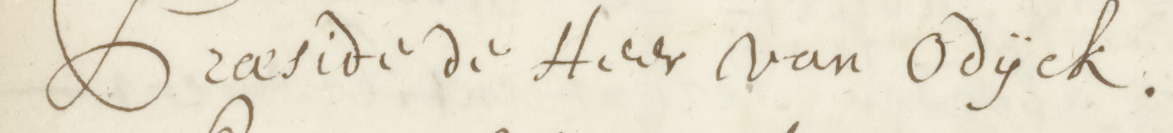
Præside de Heer van Odijck.
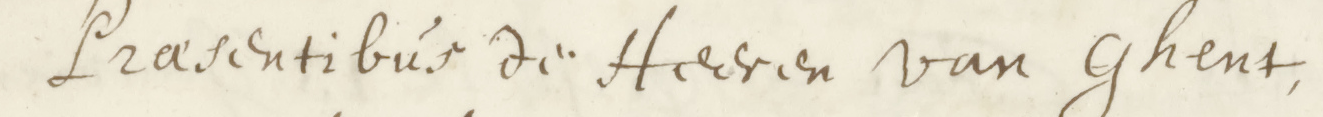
Præsentibus de Heeren van Ghent,
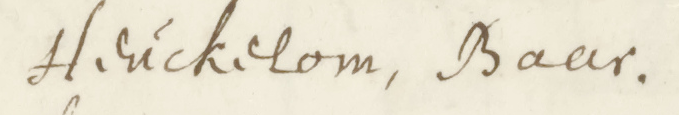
Heuckelom, Baer.
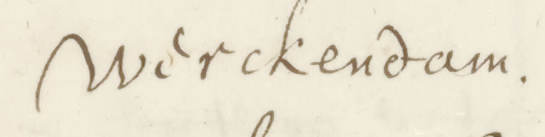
Werckendam.
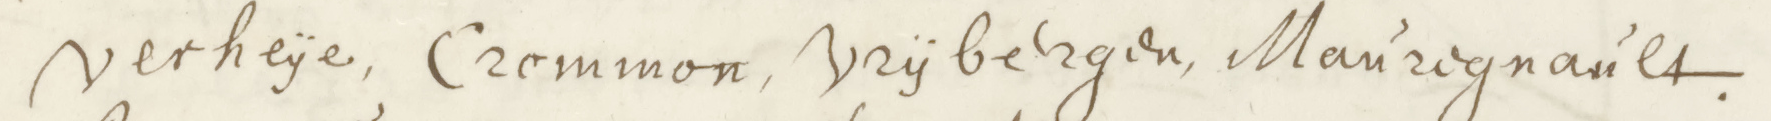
Verheije, Crommon, Vrijbergen, Mauregnault.
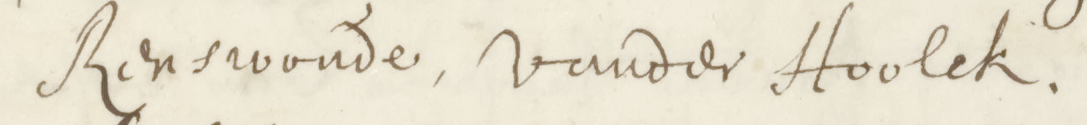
Renswoude, vander Hoolck.
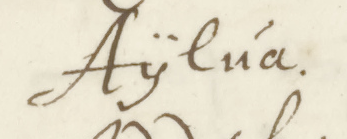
Aijlua.
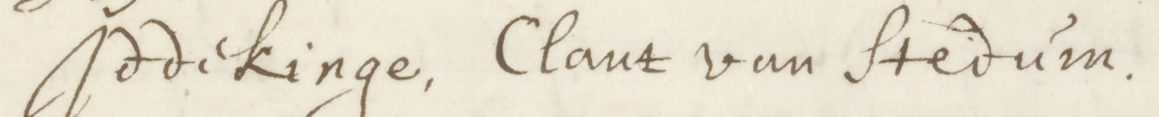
Iddekinge, Clant van Stedum.
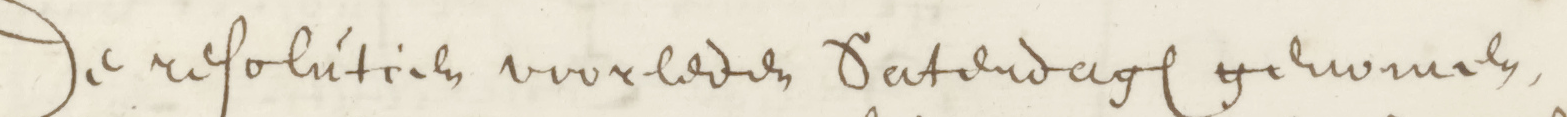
De resolutien voorleden Saterdagh genomen,
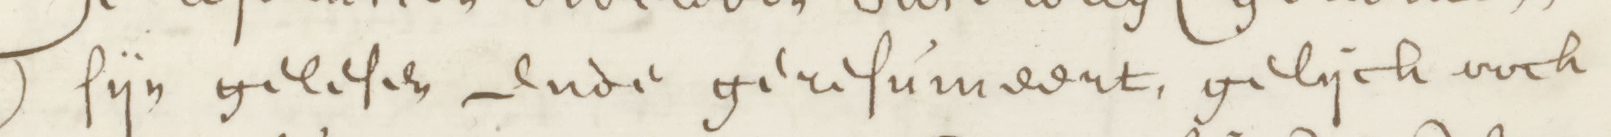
sijn gelesen ende geresumeert, gelijck oock
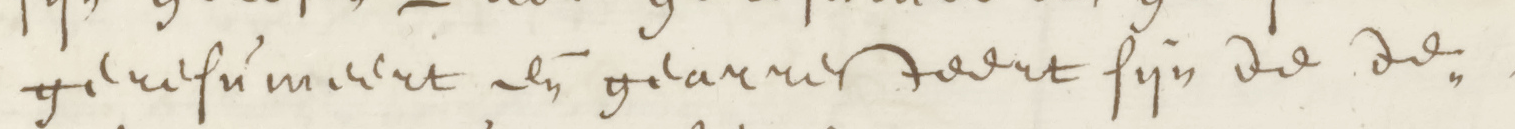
geresumeert en gearresteert sijn de de„
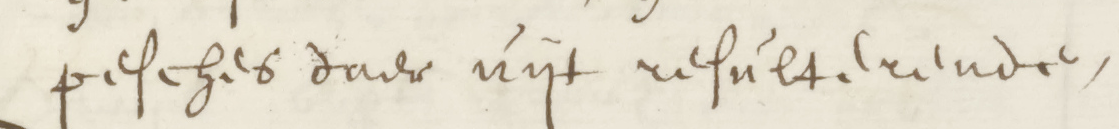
pesches daer uijt resulterende.
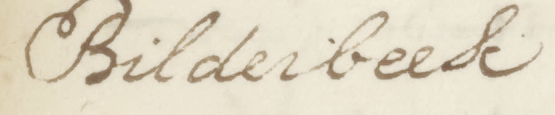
Bilderbeek
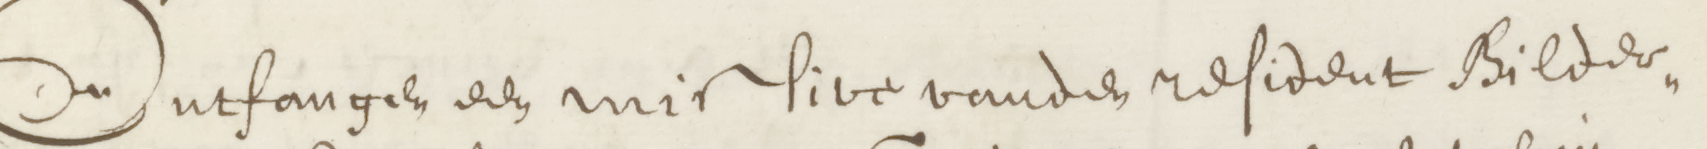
Ontfangen een missive vanden resident Bilder„
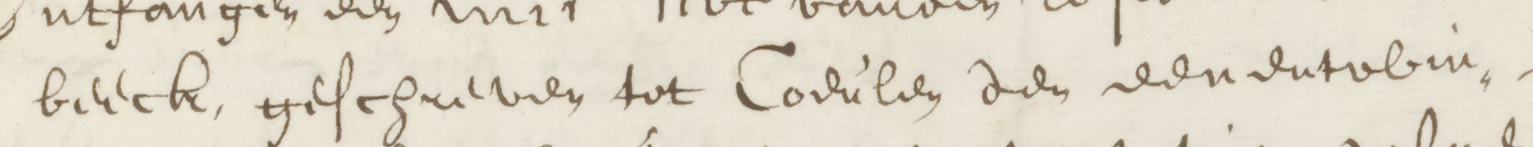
beeck, geschreven tot Coeulen den eenentwin„
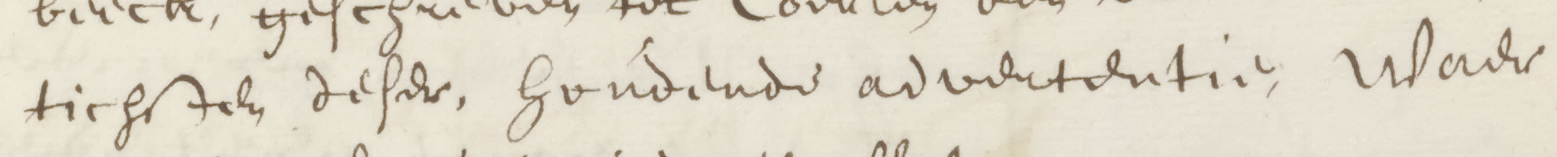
tichsten deser, houdende advertentie. Waer
